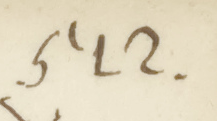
512.
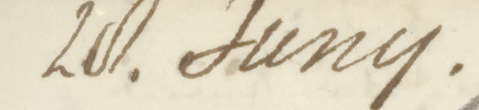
28. Juny.
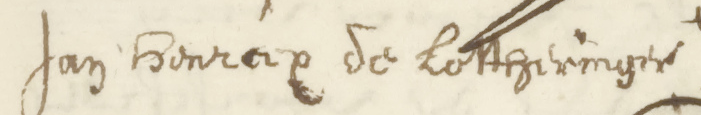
Jan Henricx de Lottheringer
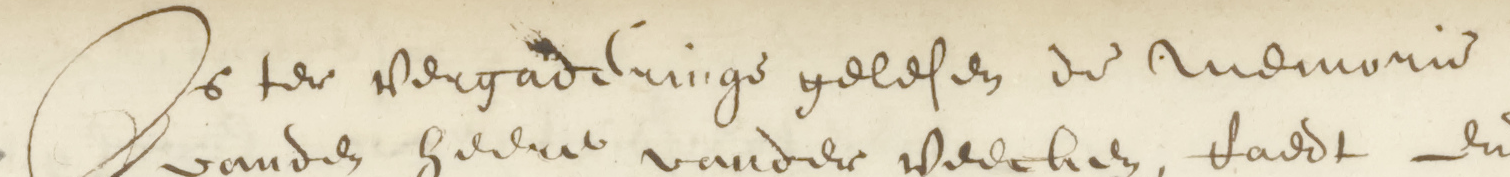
Is ter Vergaderinge gelesen de memorie
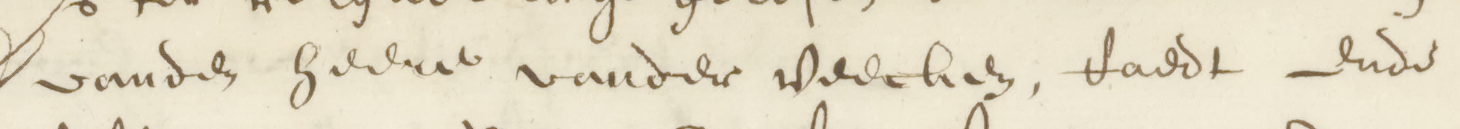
vanden heere vander Veecken, Raedt ende
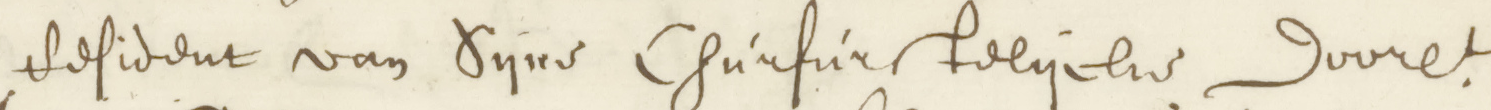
Resident van Sijne Churfurstelijcke Doorlt.
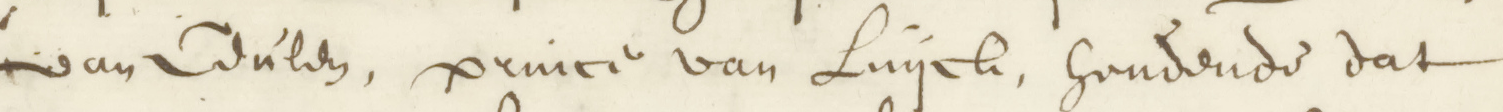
van Ceulen, prince van Luijck, houdende dat
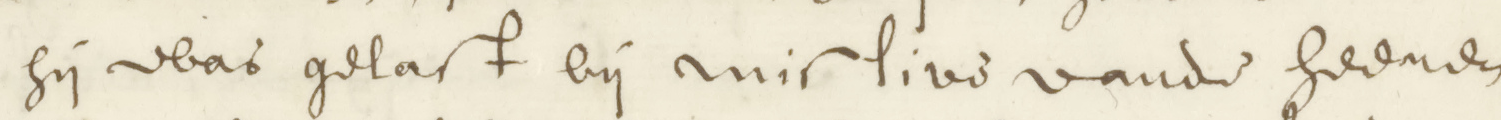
hij was gelast bij missive vande heeren
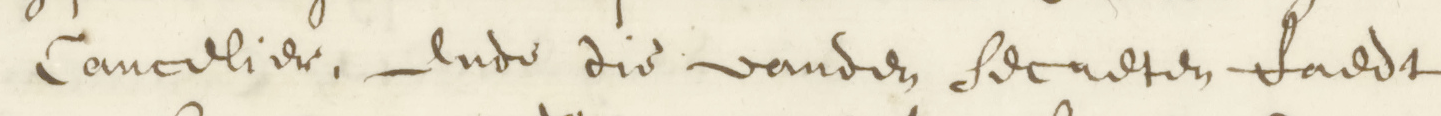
Cancelier, ende die vanden Secreten Raedt
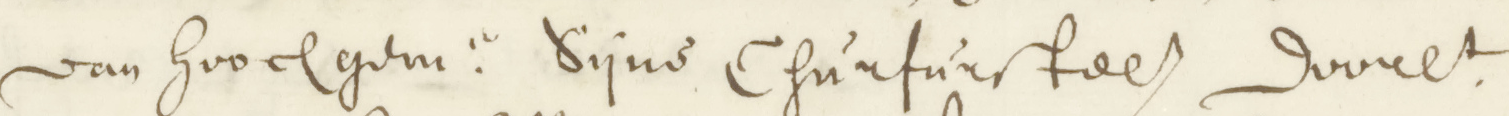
van hoochgeme. Sijne Churfurstel Doorlt.
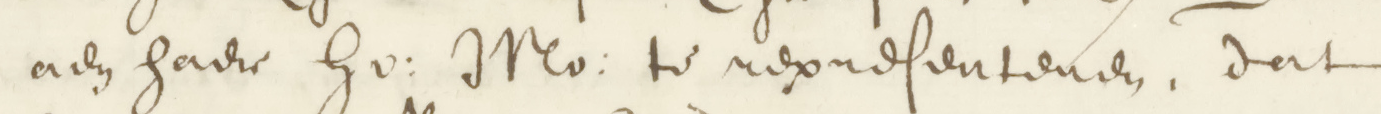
aen haer Ho:Mo: te representeren, dat
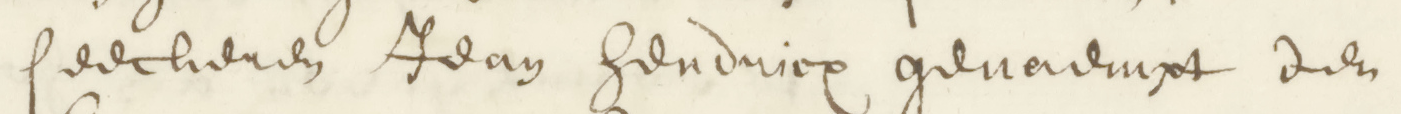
seeckeren Jean Hendricx genaempt den
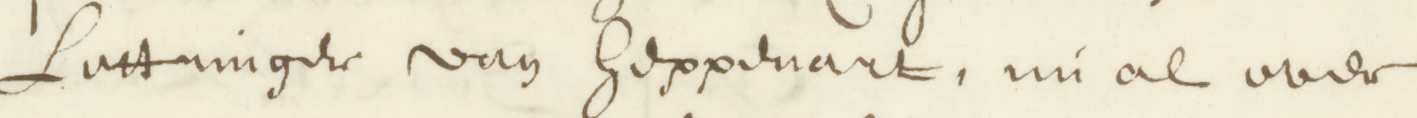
Lottringer van Heppenart, nu al over
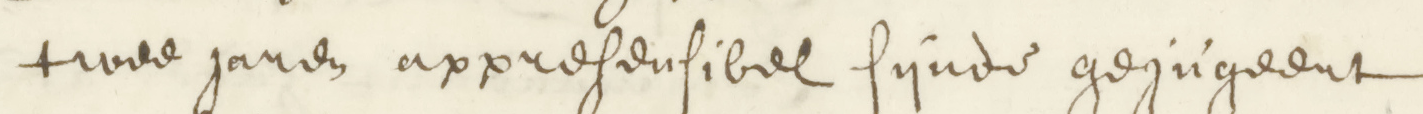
twee jaren apprehensibel sijnde gejugeert
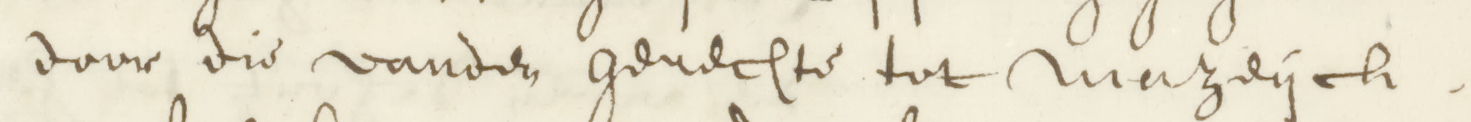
door die vanden gerechte tot Mazeijck
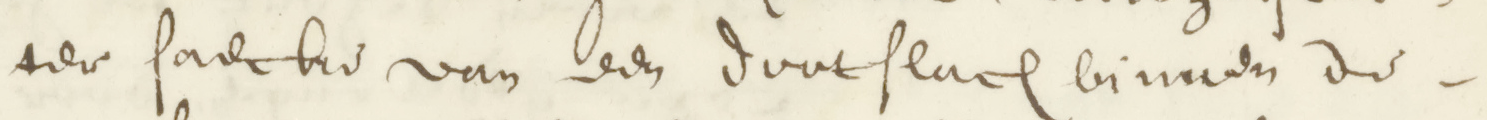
ter saecke van een dootslach binnen de
